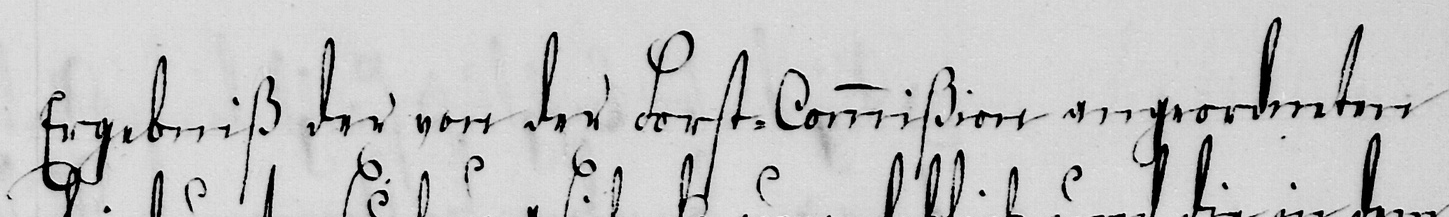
Ergebniß der von der Forst-Commißion angeordneten
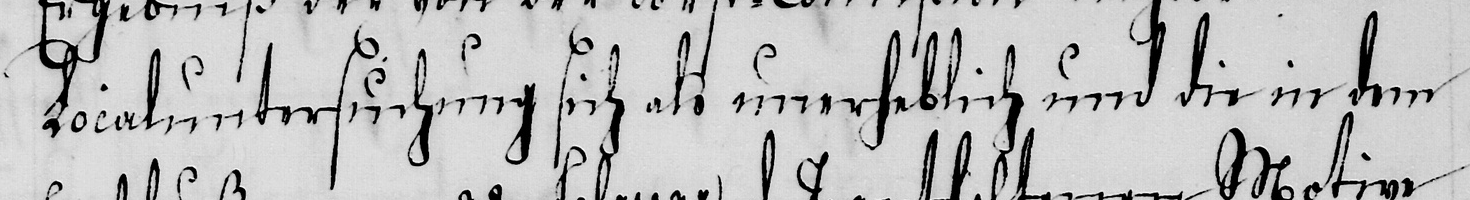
Localuntersuchung sich als unerheblich und die in dem
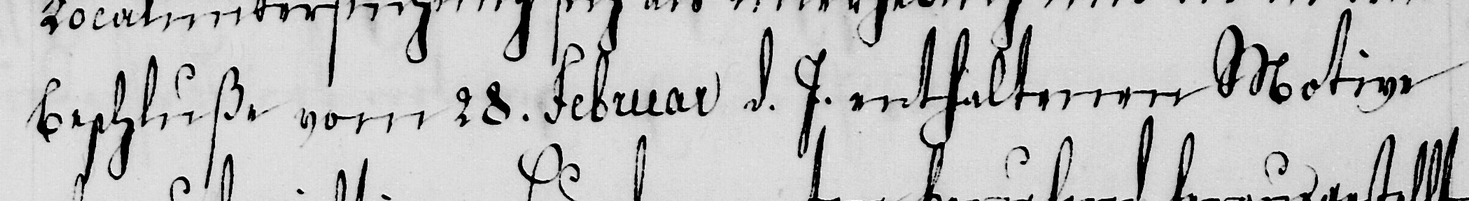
Beschluße vom 28. Februar d. J. enthaltenen Motive
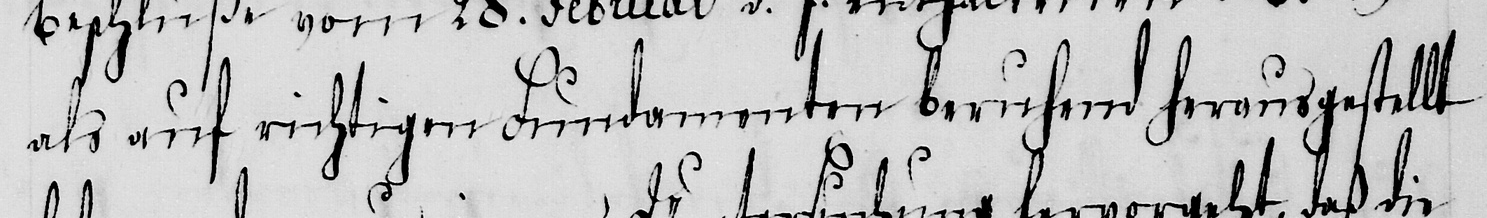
als auf richtigen Fundamenten beruhend herausgestellt
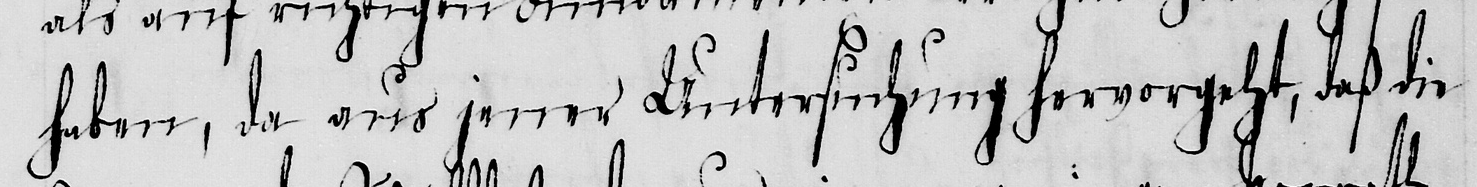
haben, da aus jener Untersuchung hervorgeht, daß die
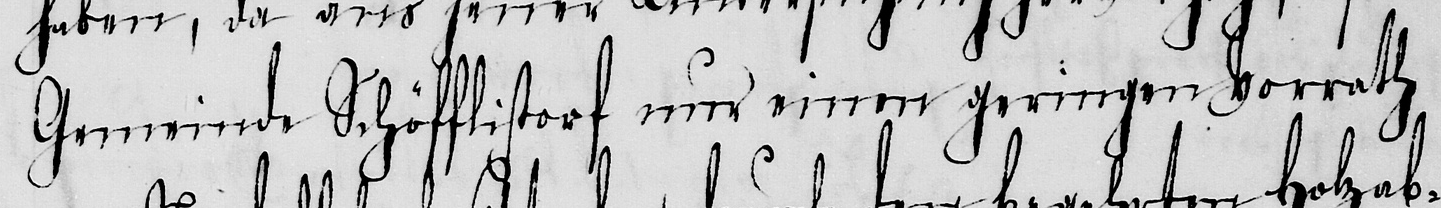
Gemeinde Schöfflistorf nur einen geringen Vorrath
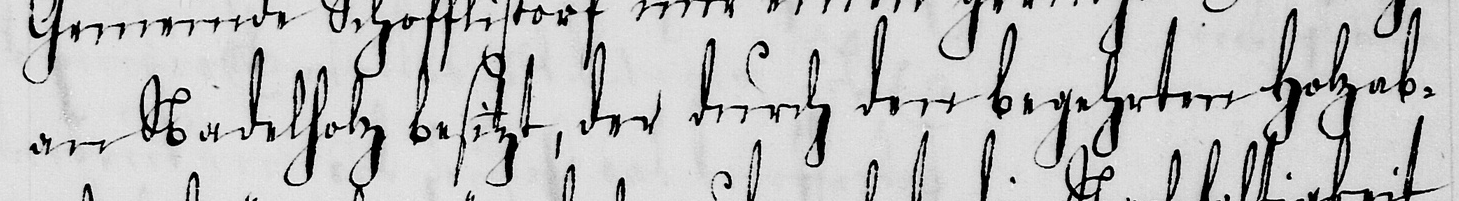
an Nadelholz besitzt, der durch den begehrten Holzab¬
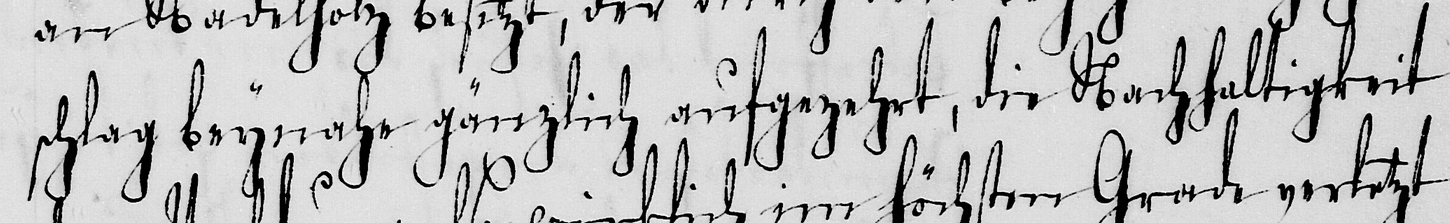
schlag beynahe gänzlich aufgezehrt, die Nachhaltigkeit
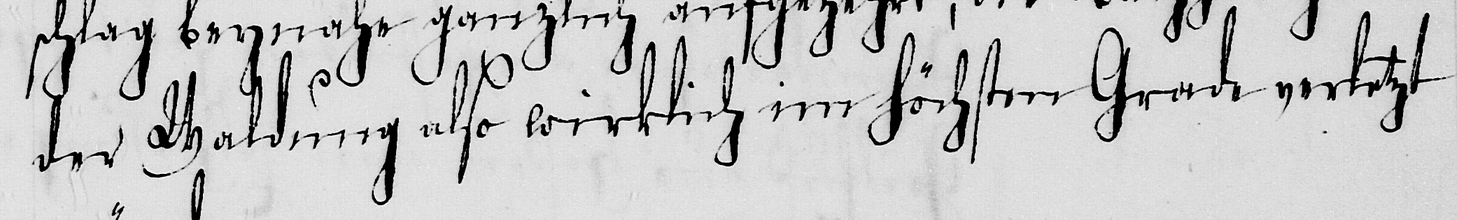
der Waldung also wirklich im höchsten Grade verletzt
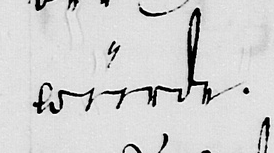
würde.
